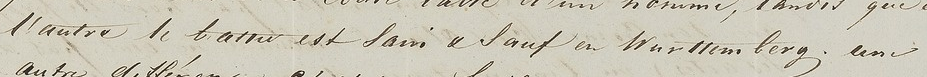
l'autre le battu est sain & sauf en Wurttemberg. Une
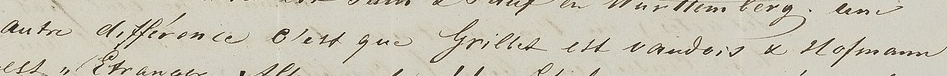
autre différence c'est que Grillet est vaudois & Hofmann
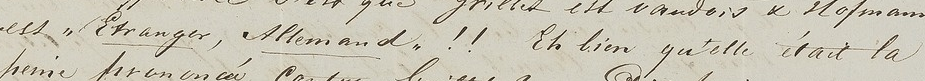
est « Etranger, Allemand »! ! Et bien quelle était la
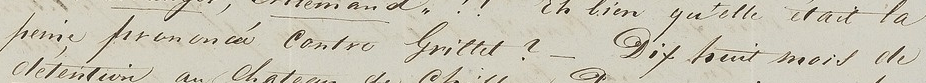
peine prononcée contre Grillet? – Dix huit mois de
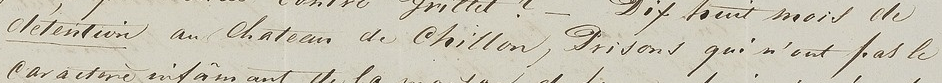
détention au château de Chillon, Prisons qui n'ont pas le
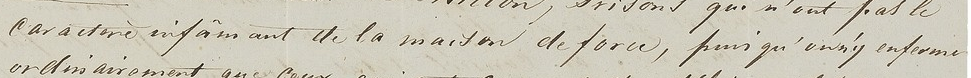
caractère infâmant de la maison de force, puisqu'on n'y enferme
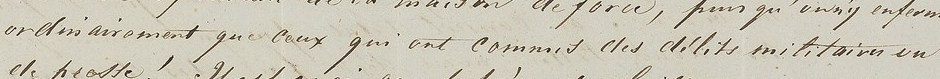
ordinairement que ceux qui ont commis des délits militaires ou
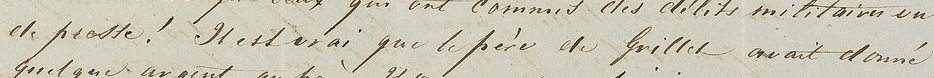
de presse! Il est vrai que le père de Grillet avait donné
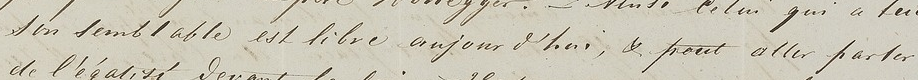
son semblable est libre aujourd'hui, & peut´ aller parler
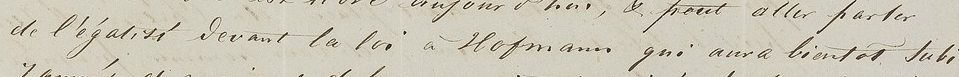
de l'égalité devant la loi à Hofmann qui aura bientôt subi
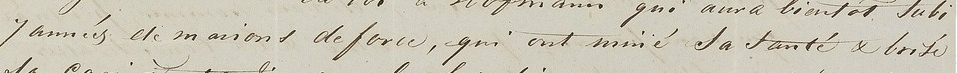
7 années de maisons de force, qui ont ruiné sa santé & brisé
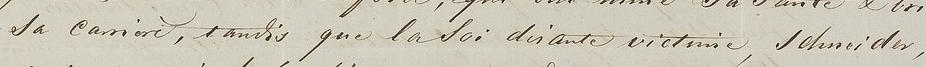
sa carrière, tandis que la soi disante victime, Schneider,
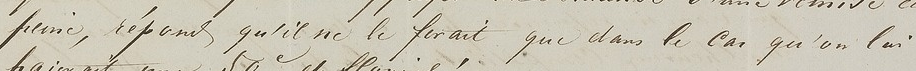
peine, répond qu'il ne le ferait que dans le cas qu'on lui
